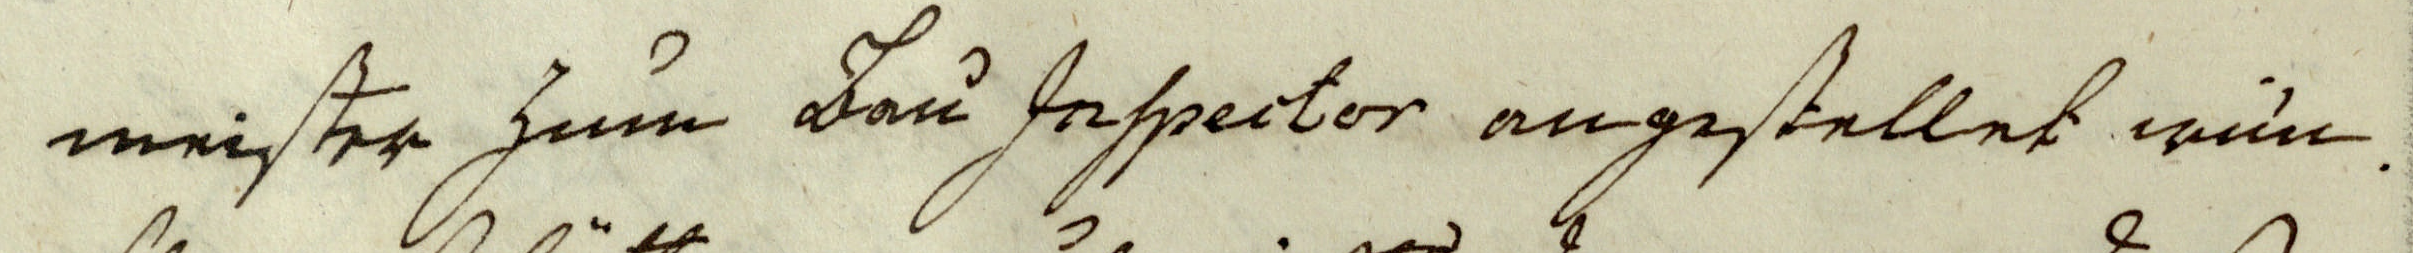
meister zum Bau Inspector angestellet wün¬
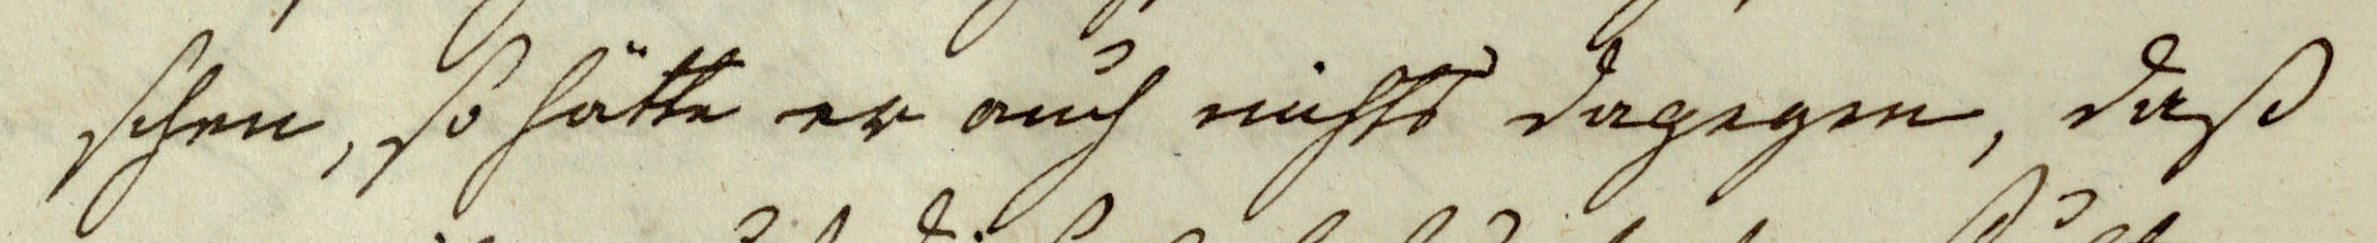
schen, so hätte er auch nichts dagegen, daß
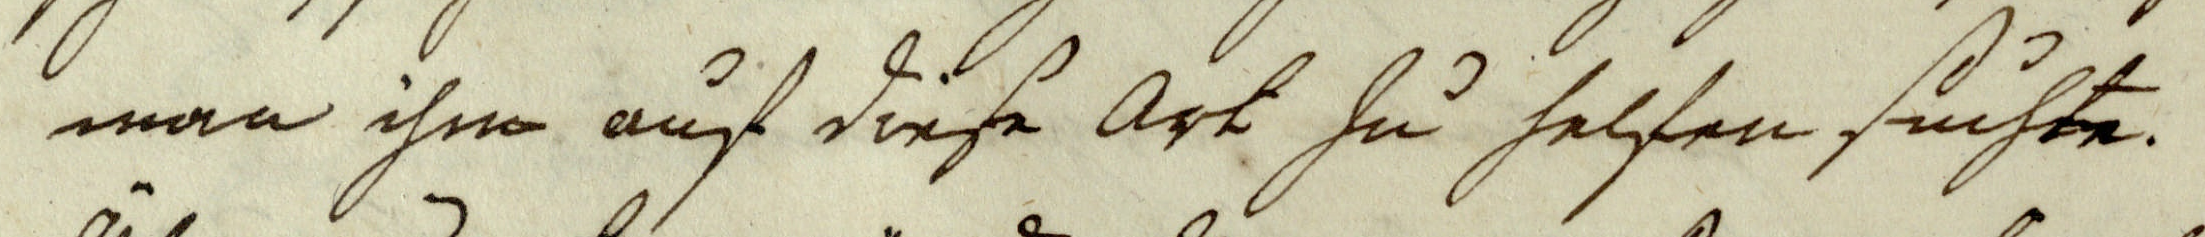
man ihm auf diese Art zu helfen suchte.
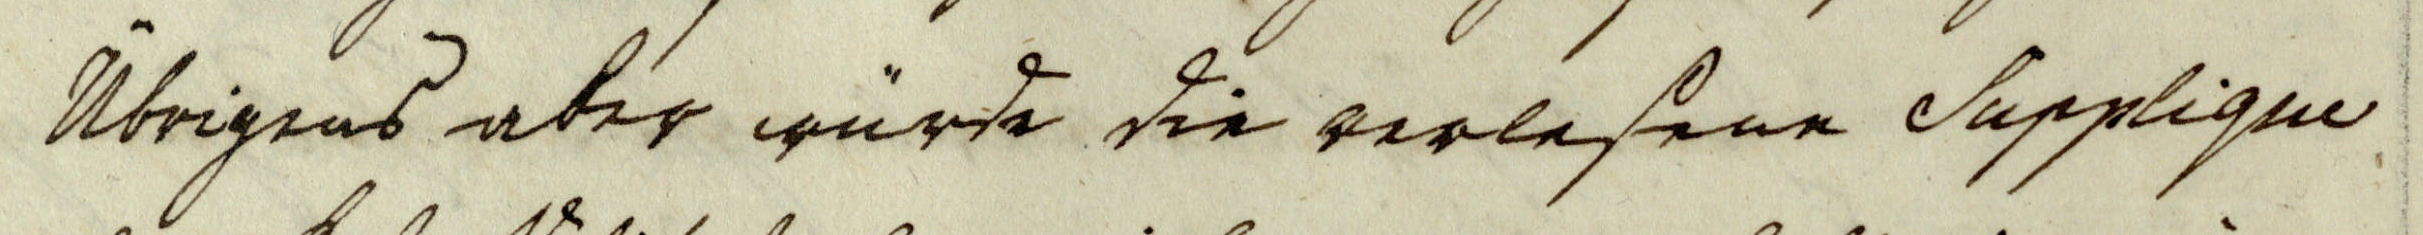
Übrigens aber würde die verlesene Supplique
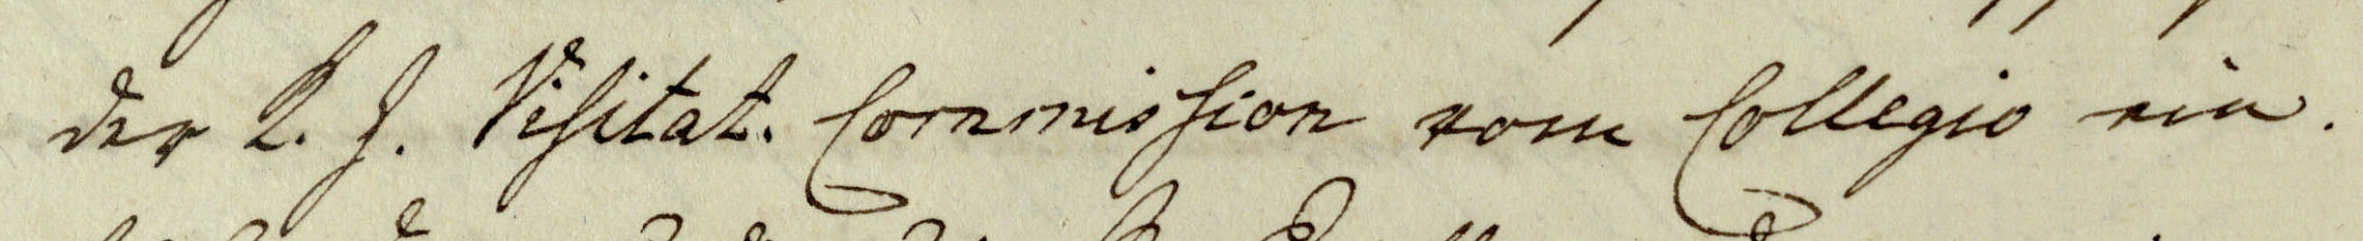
der K. H. Visitat. Commission vom Collegio ein¬
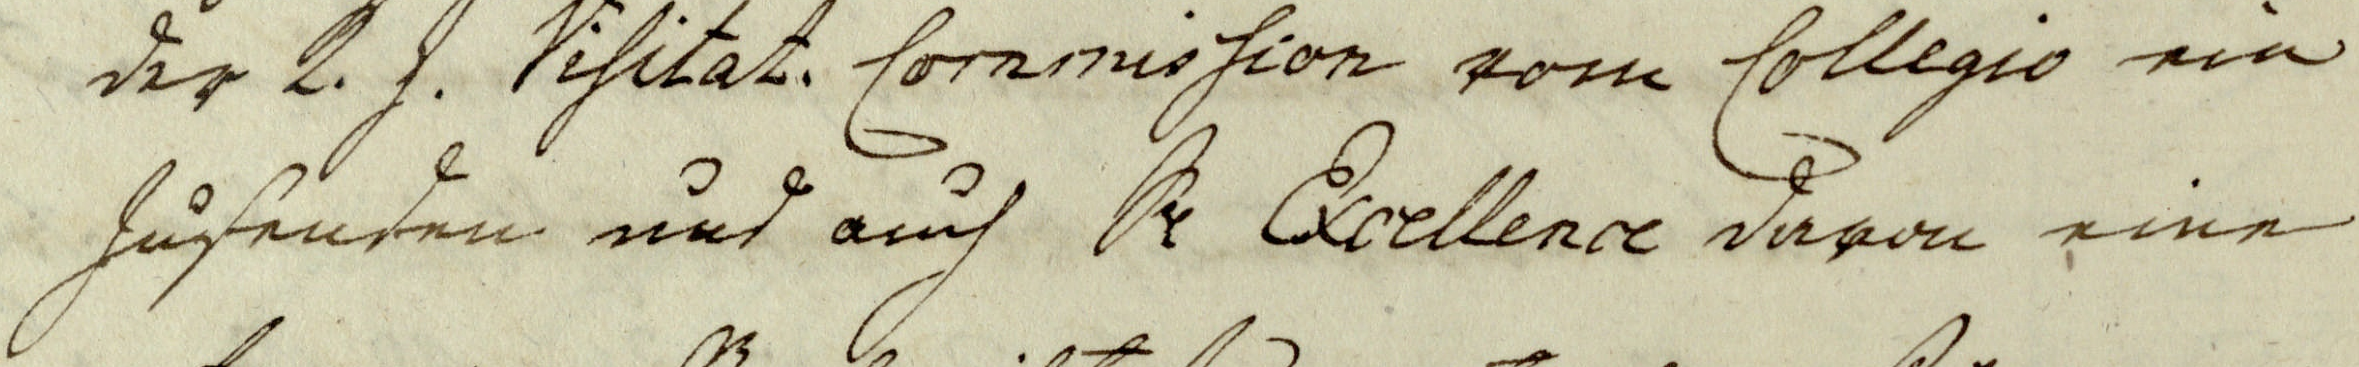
zusenden und auch Sr. Excellence davon eine
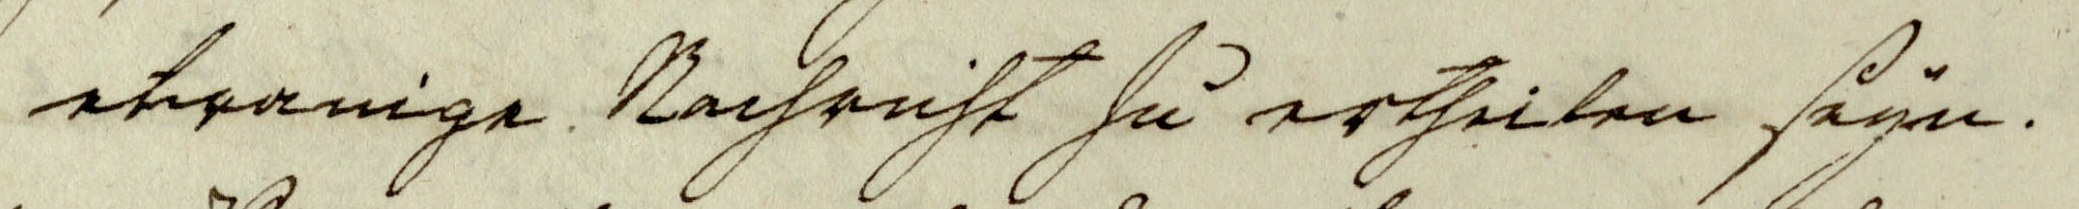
etwanige Nachricht zu ertheilen seÿn.
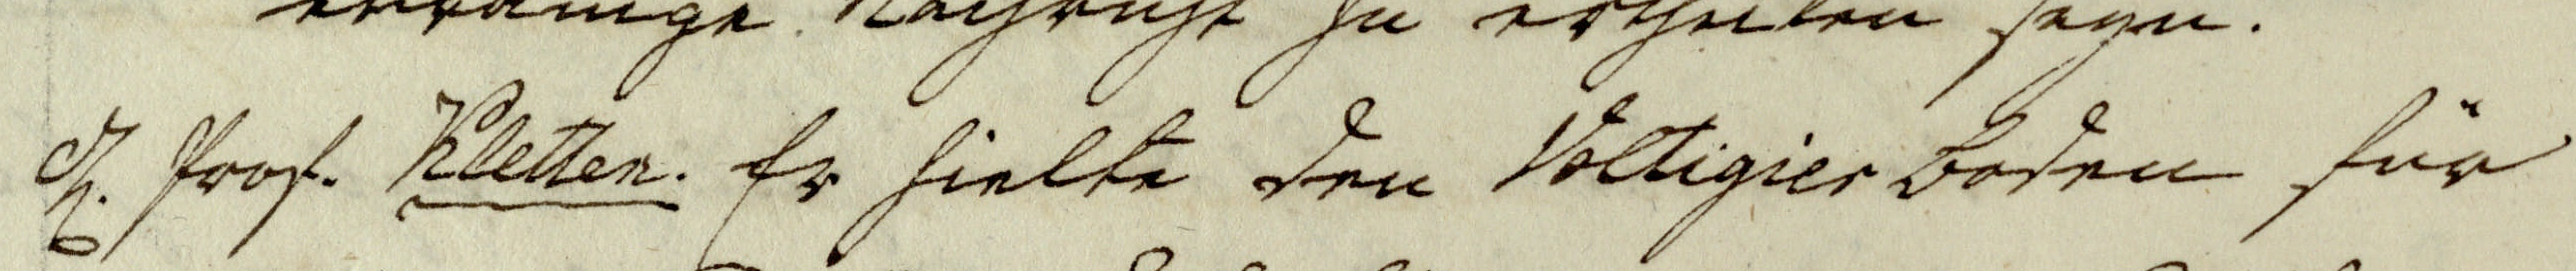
dh. Prof. Kletten. Er hielte den Voltigier Boden für
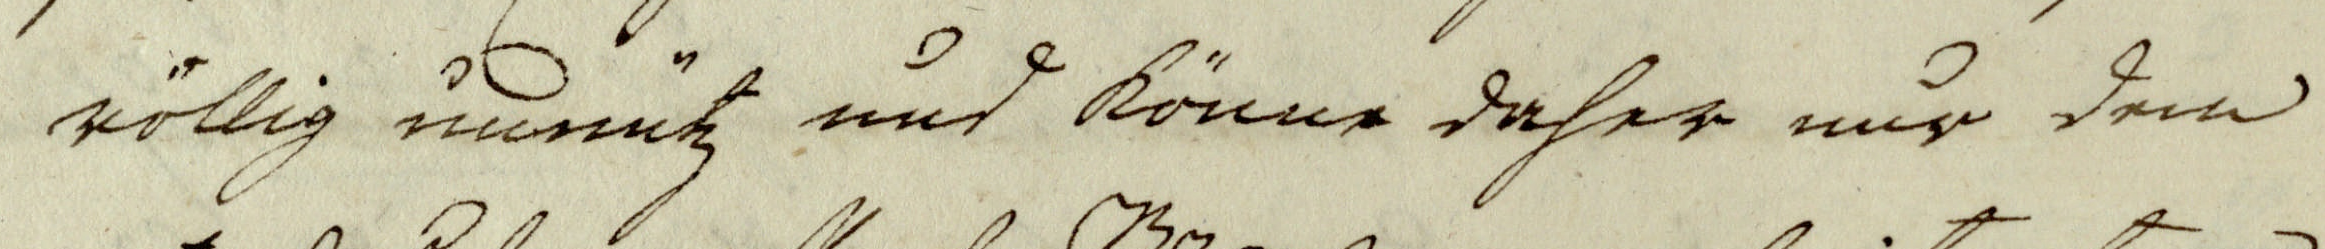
völlig unnütz und könne daher nur dem
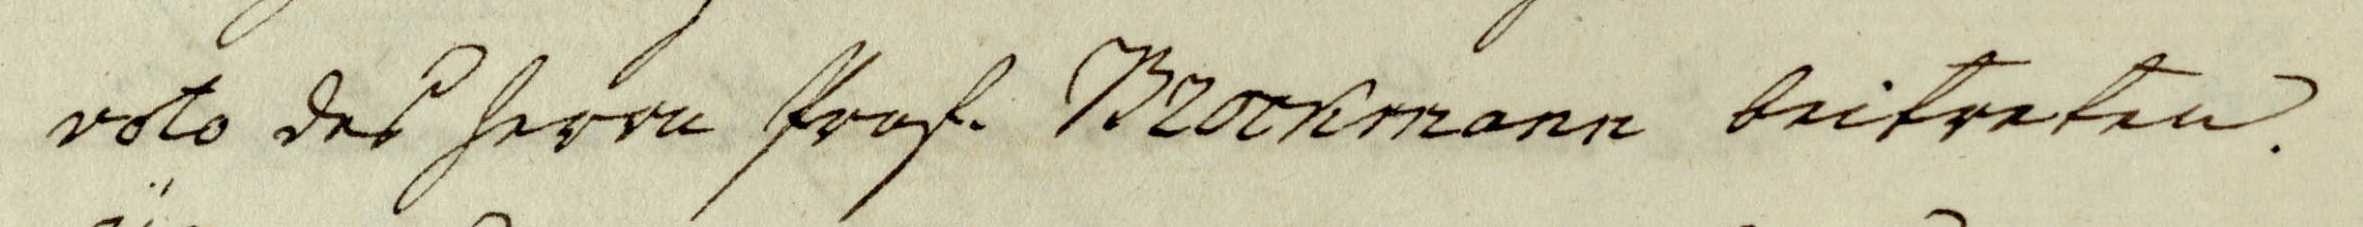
voto des Herrn Prof. Brockmann beitreten.
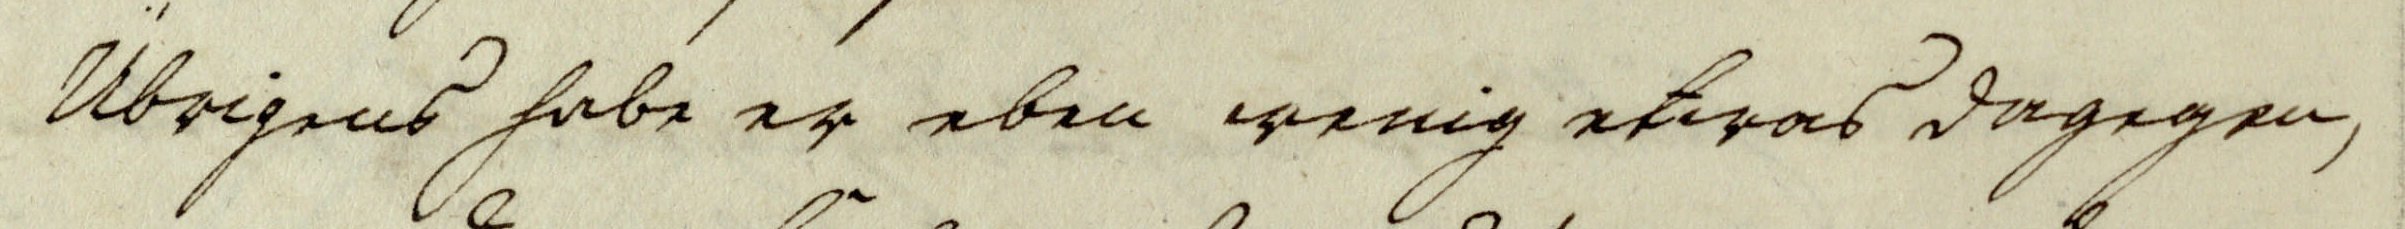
Übrigens habe er eben wenig etwas dagegen,
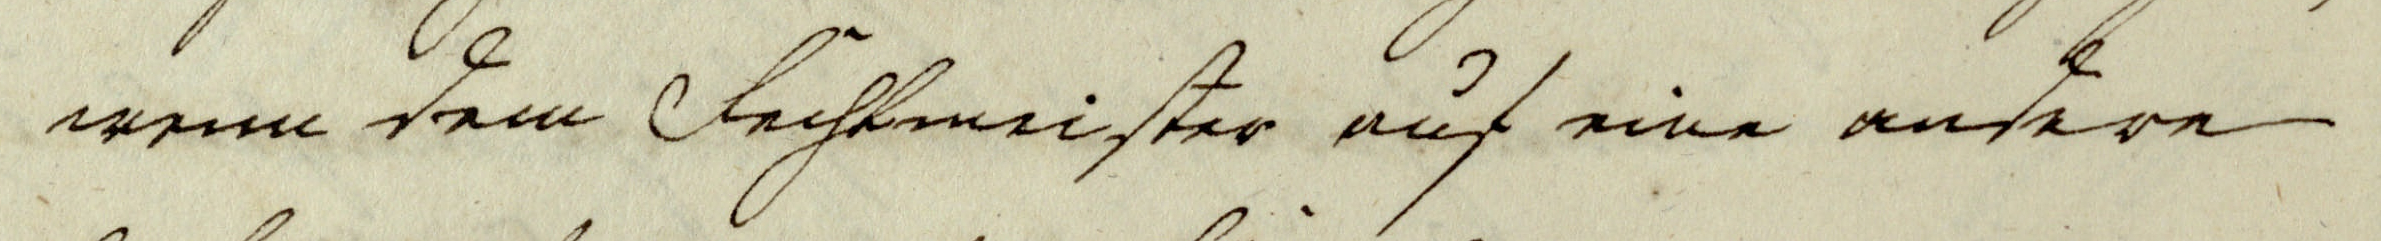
wenn dem Fechtmeister auf eine andere
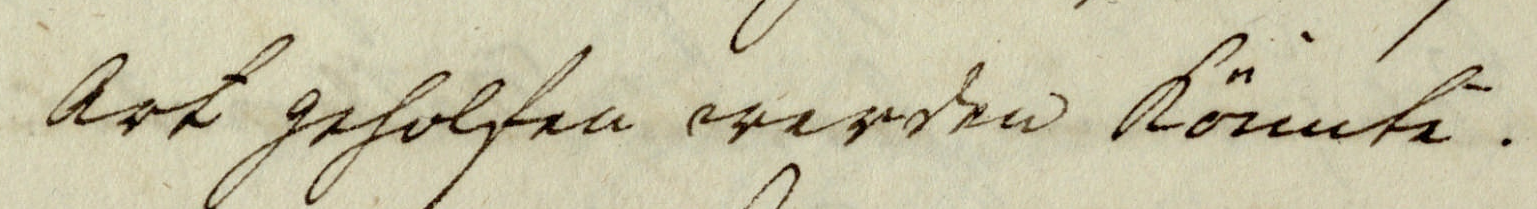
Art geholfen werden könnte.
